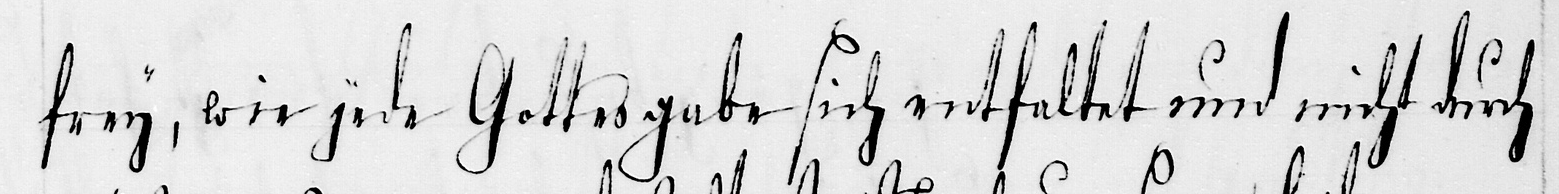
frey, wie jede Gottesgabe sich entfaltet und nicht durch
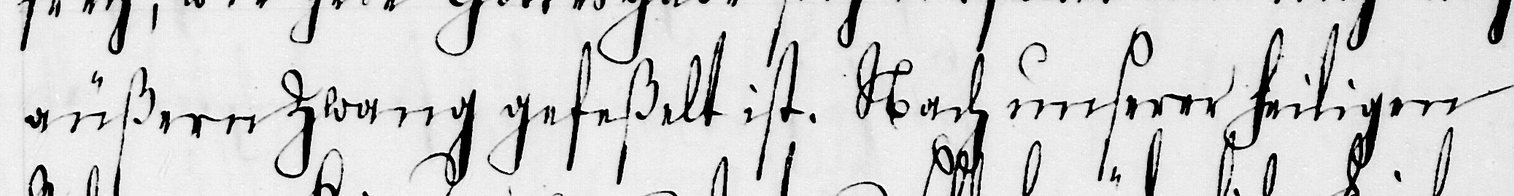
äußern Zwang gefeßelt ist. Nach unserer heiligen
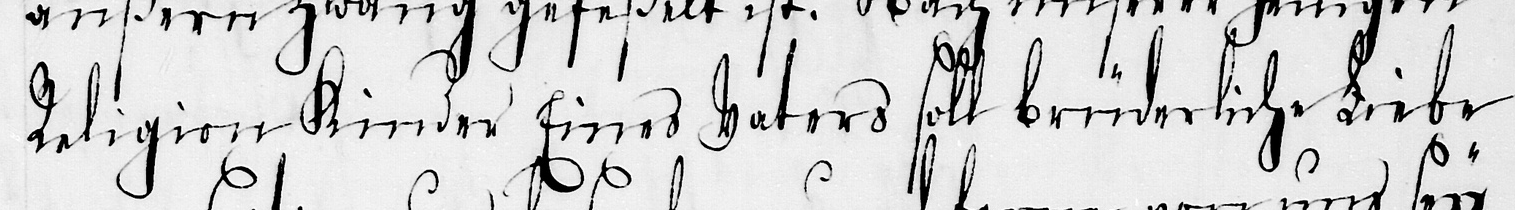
Religion Kinder Eines Vaters soll brüderliche Liebe
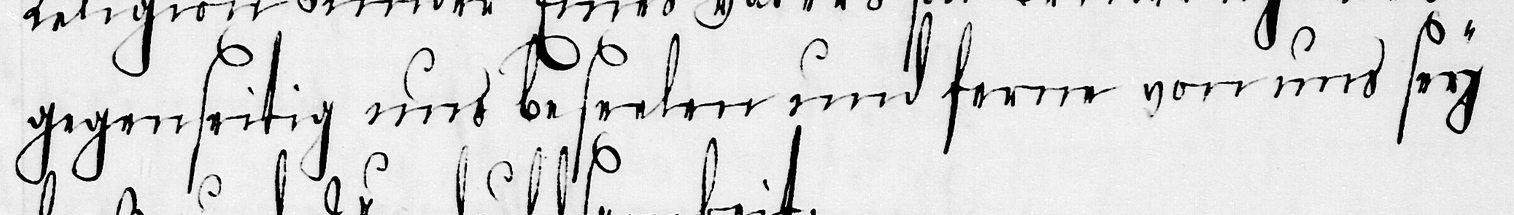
gegenseitig uns beseelen und ferne von uns sey
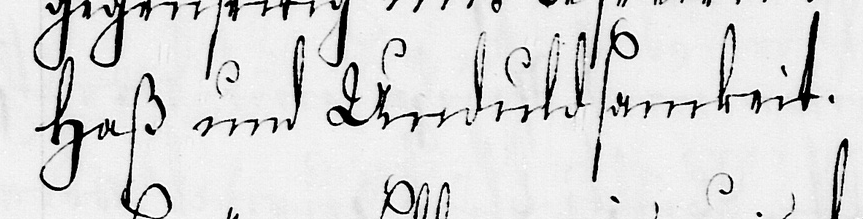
Haß und Unduldsamkeit.
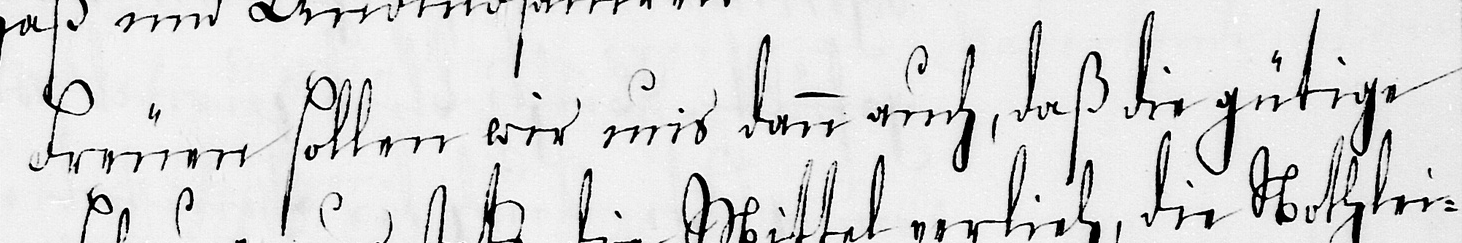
Freuen sollen wir uns dann auch, daß die gütige
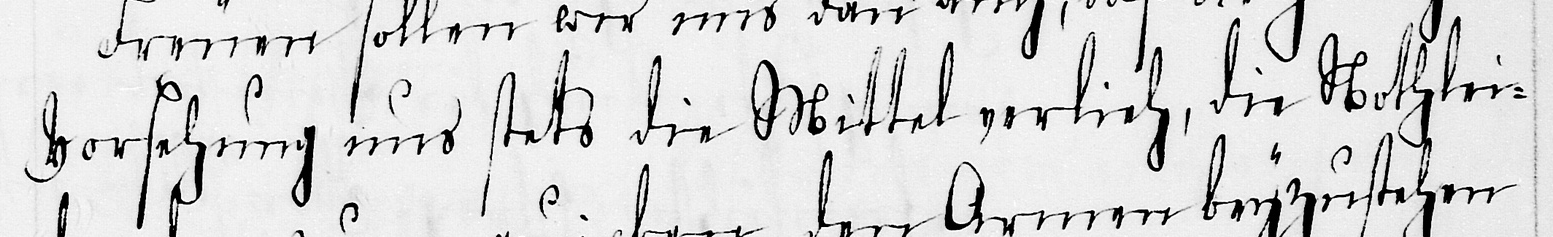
Vorsehung uns stets die Mittel verlieh, die Nothlei¬
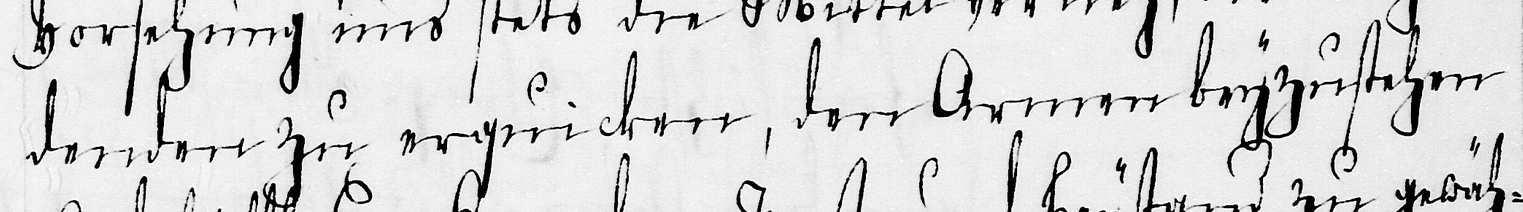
denden zu erquicken, den Armen beyzustehen
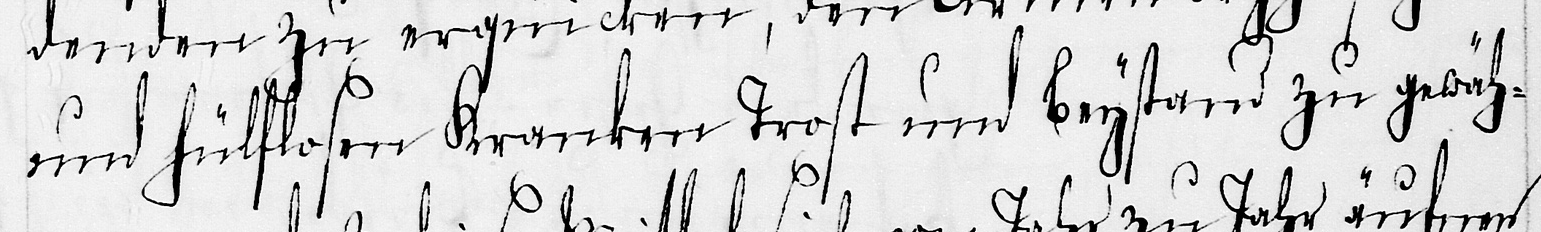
und hülflosen Kranken Trost und Beystand zu gewäh¬
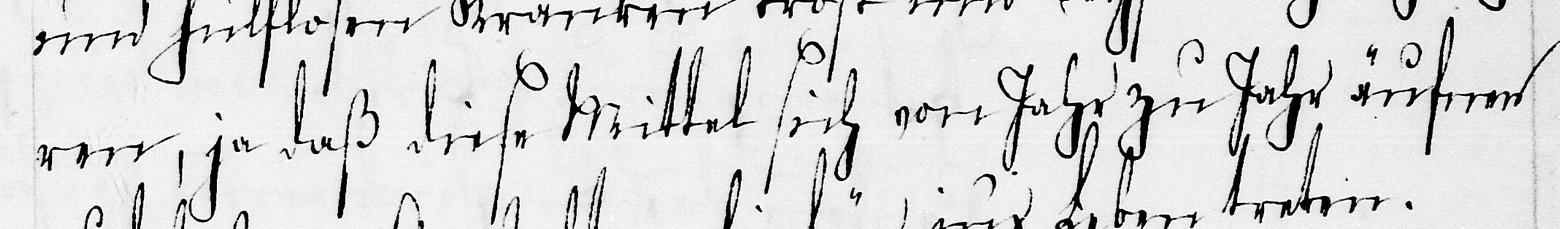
ren, ja daß diese Mittel sich von Jahr zu Jahr äufnen
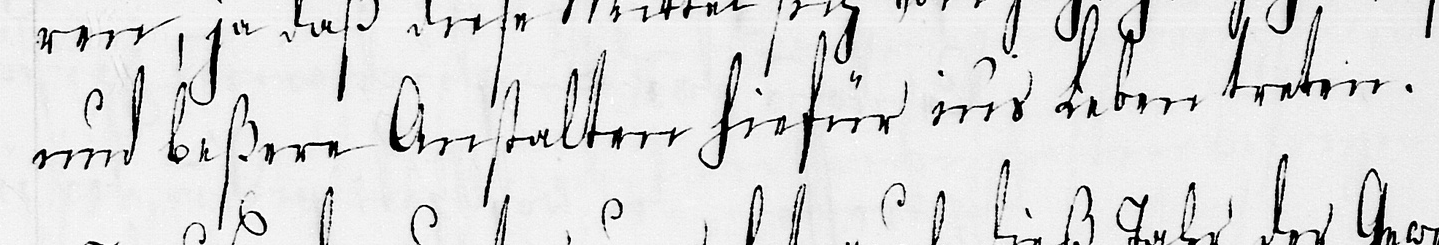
und beßere Anstalten hiefür in’s Leben treten.
